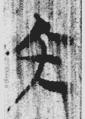內（入）
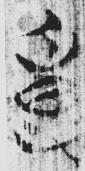事（仕）
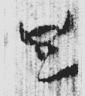也
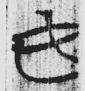女（如）
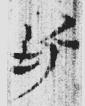此
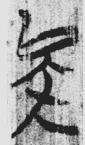矣
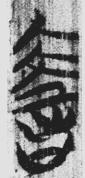○（顏）
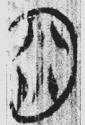囦（淵）
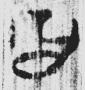曰
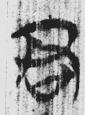君
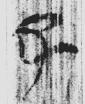子
